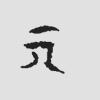亓（其）
